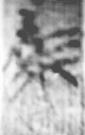馬
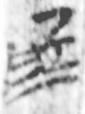爲
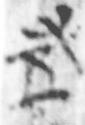○（右）
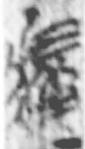○（服）
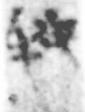牧
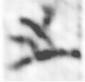之
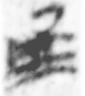爲
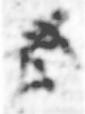○（右）
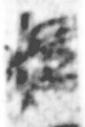驂
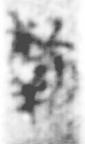新（新）
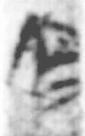官
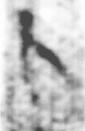人
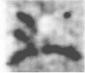之
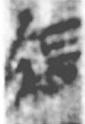駟
